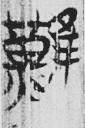難
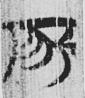所
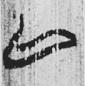㠯
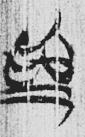爲
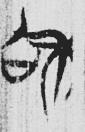和
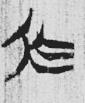於
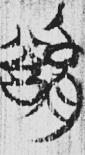豫
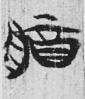○（莊）
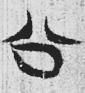公
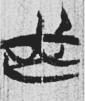或（又）
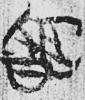䎽（問）
